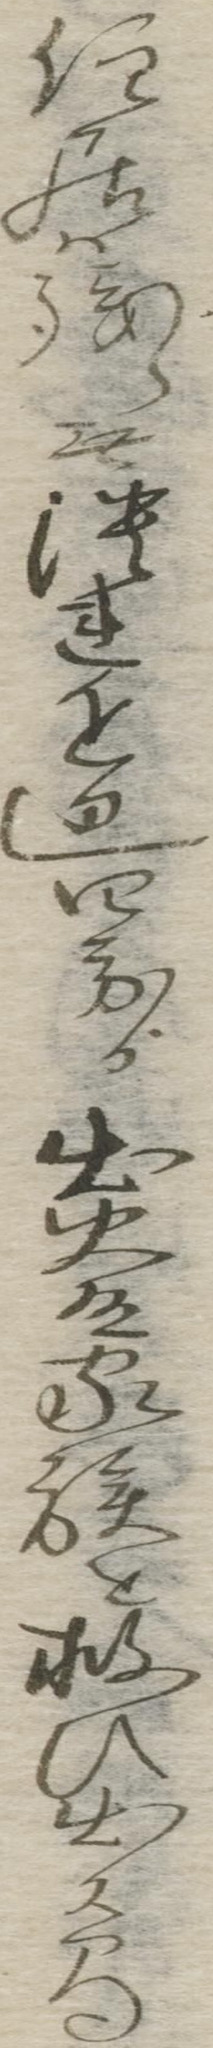住居ハ残り無潰れ近廻四方ゟ出火故家族を救ひ出ス間
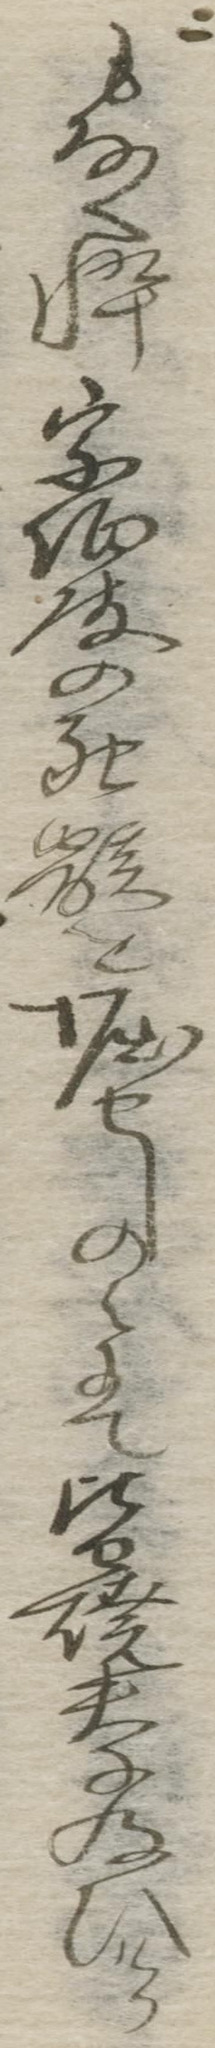もなく悴宗伯殿の死骸を堀せしのみにて皆焼失に及ひける
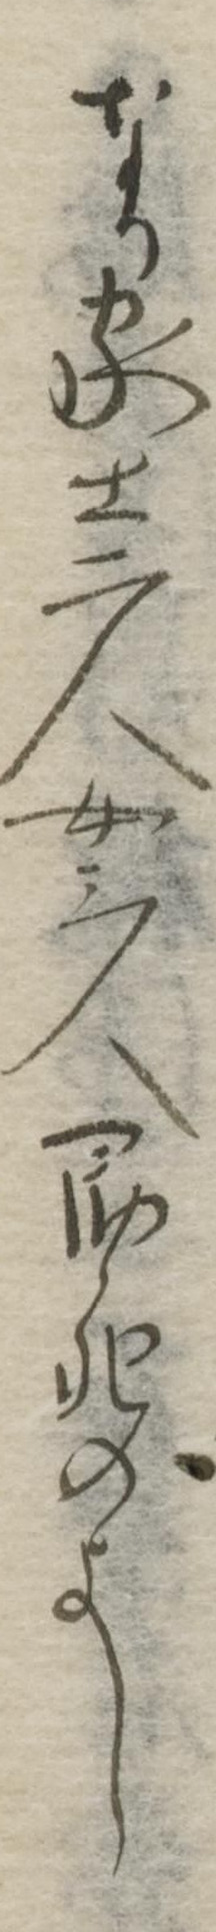なり家士二人女三人即死のよし

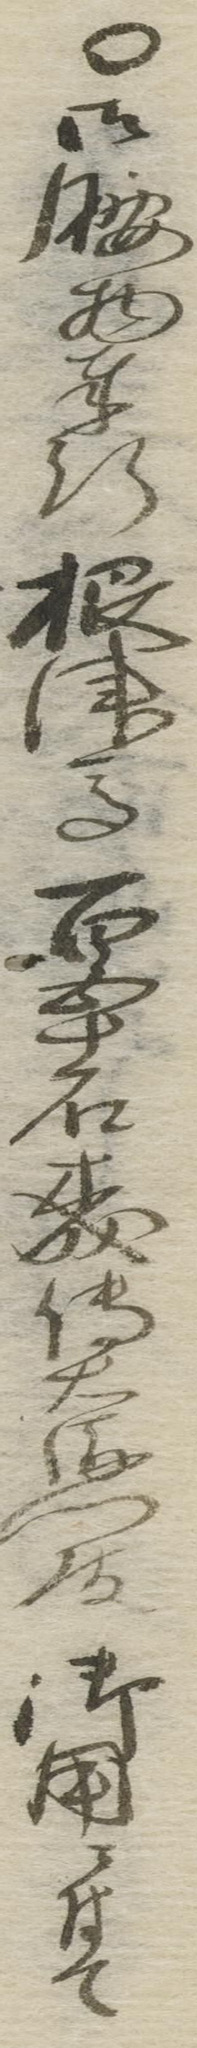○御腰物奉行根津高百五十石森傳右衛門殿御用ニ付て
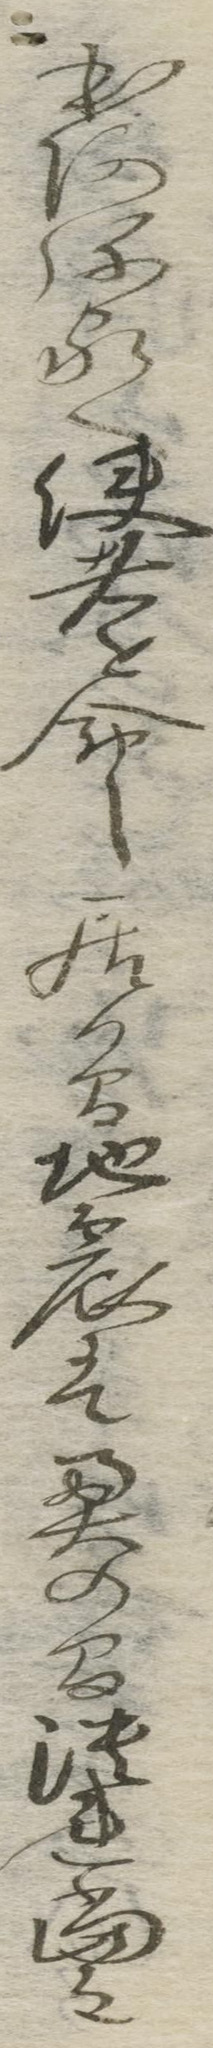本阿弥家へ使者を命し居る間地震にて奥の間潰れ当主
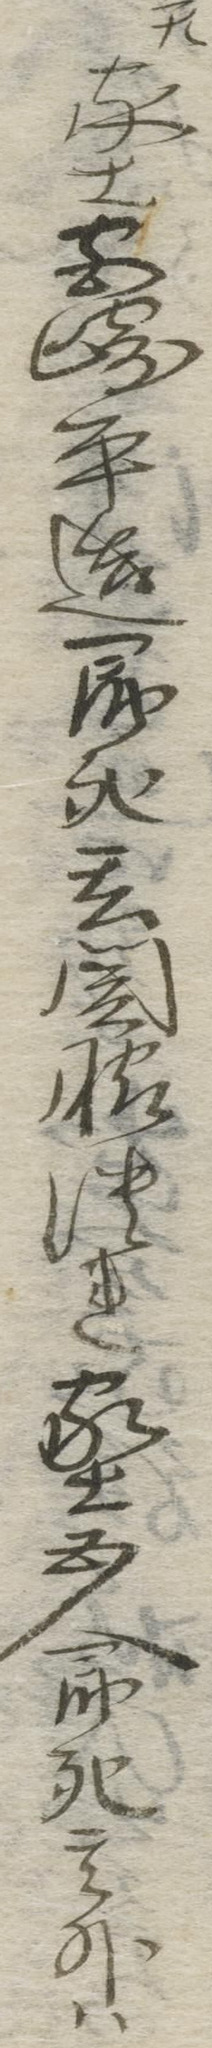并家士宮崎平造即死玄関脇潰れ家士五人即死其外ハ
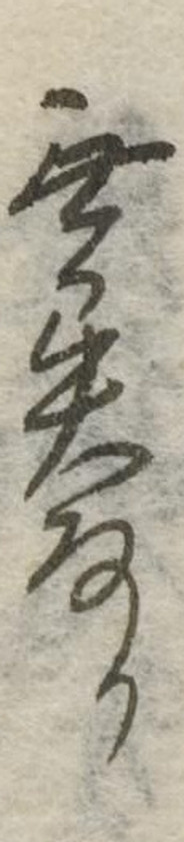無災なり
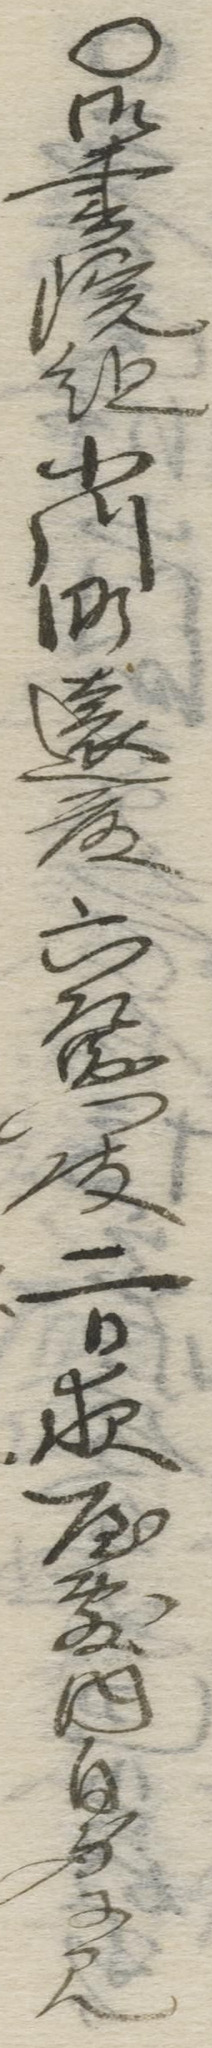○御書院組小川町遠藤六左衛門殿二日夜屋敷内自身に見
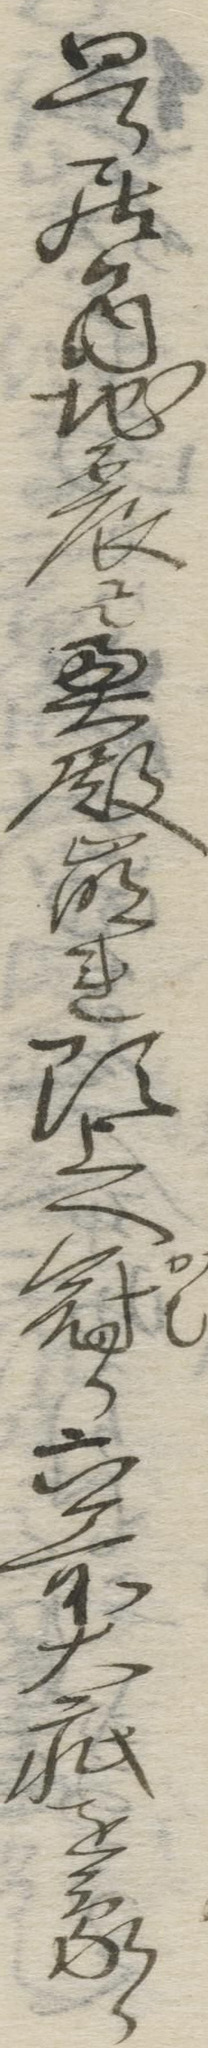廻り居る内地震ニて奥殿崩頭上へ冠り六ケ所大疵を蒙り
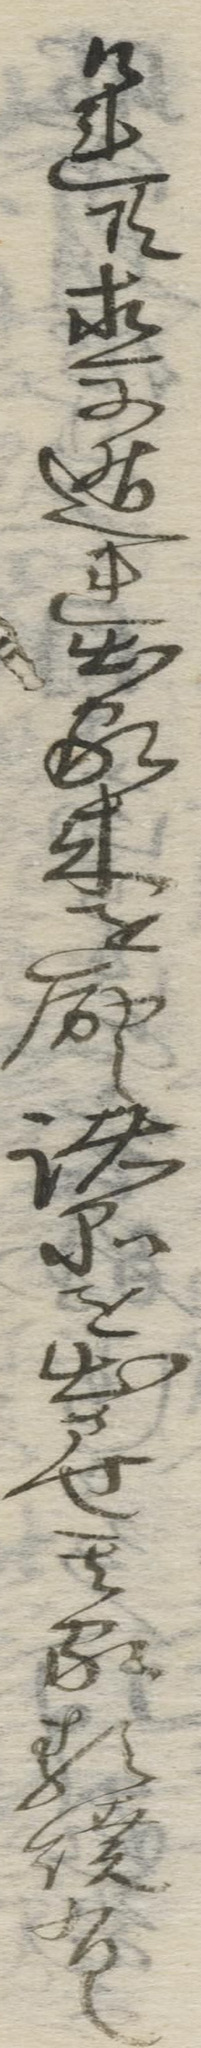けれ共直に遁れ出家来を励し諸品を出させ其家類焼有之
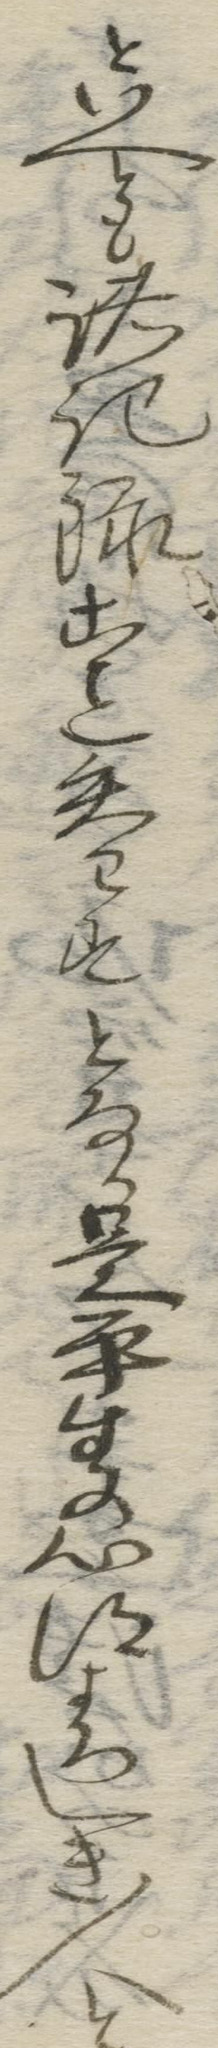といへとも諸記録等迄失わすとなり是平生の心得よろしき人と
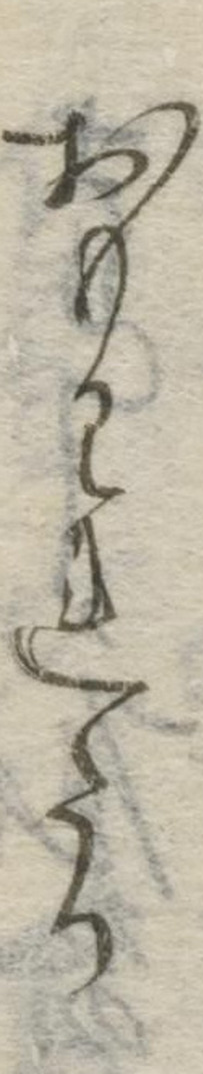おもわれたり
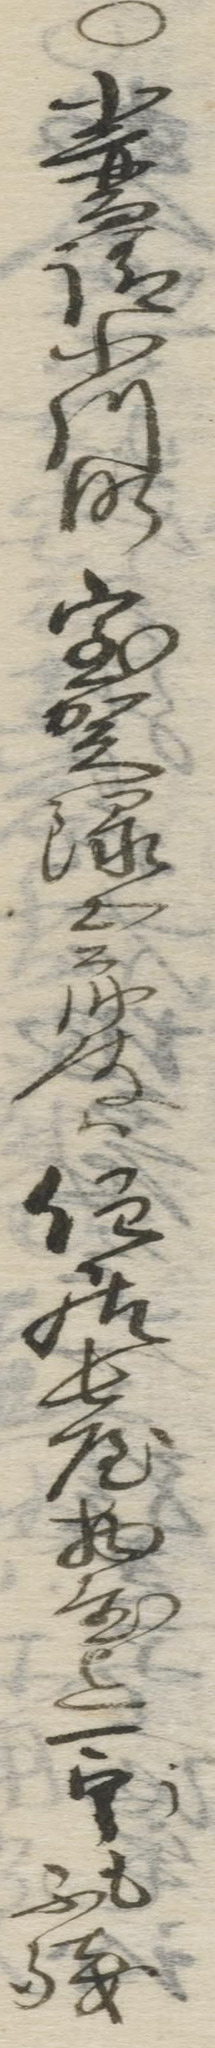○小普請小川町室賀録五郎殿ハ住居長屋物置迄一宇も不残
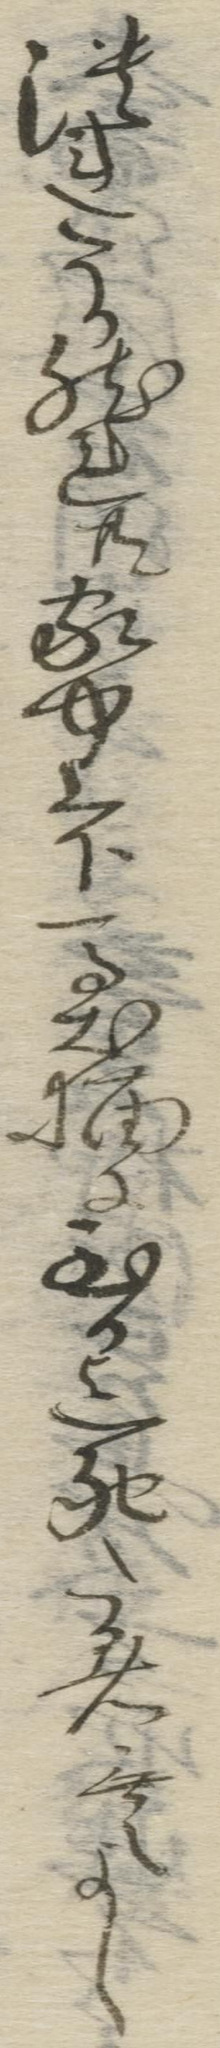潰れたり然れ共家中上下馬犬猫に至る迄死たる者無之よし
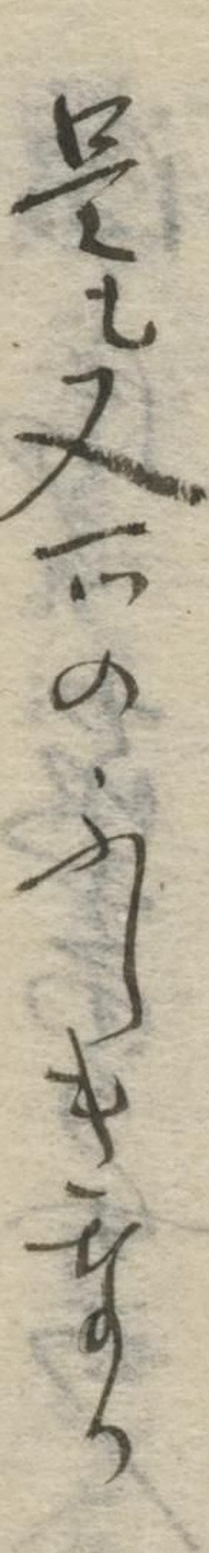是も又所一つのふしきなり
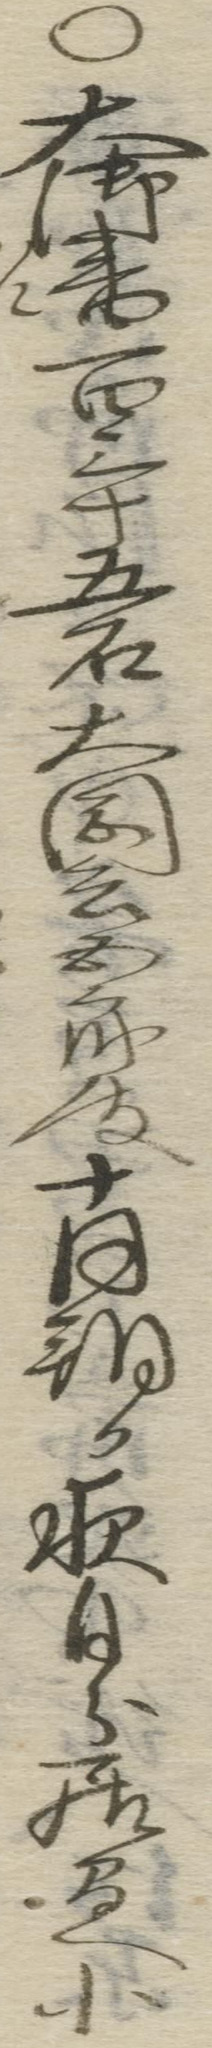○大御番百三十五石大岡兵五郎殿十月朔日夜自分居間へ小
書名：江戸中諸屋敷　地震竒談録
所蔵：東京大学地震研究所図書室 Earthquake Research Institute Library, The University of Tokyo, JAPAN
